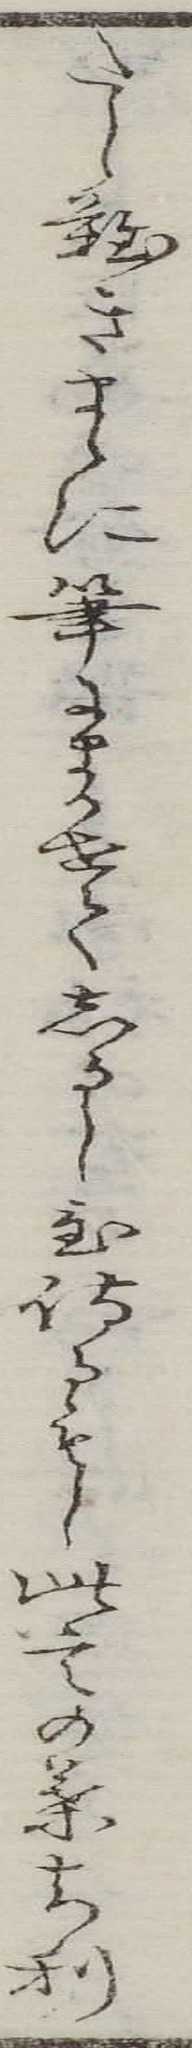たし難きまゝに筆にまかせてしるし置伝るもし此言の葉ちり
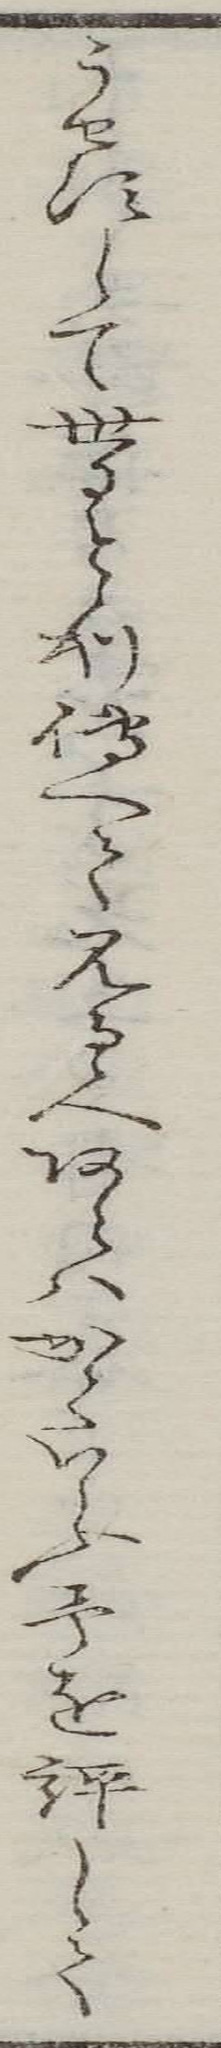うせすして世にとり伝へて見る人あらはかくいふ予を評して
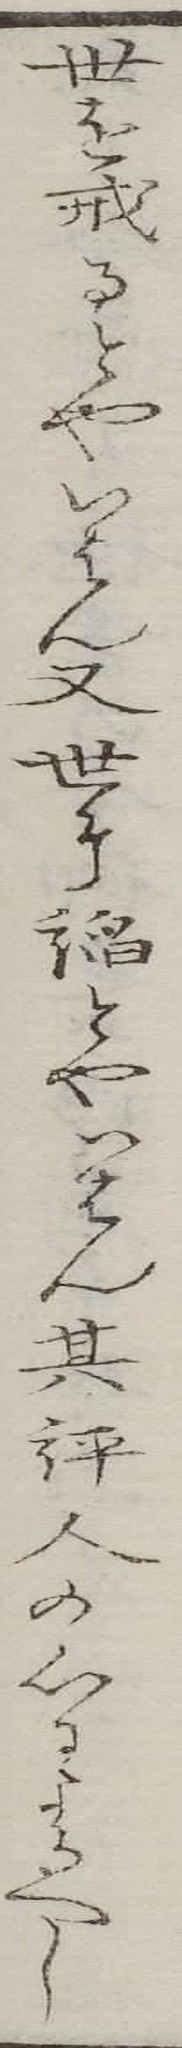世を戒るとやいはん又世に論とやいはん其評人の心によるへし
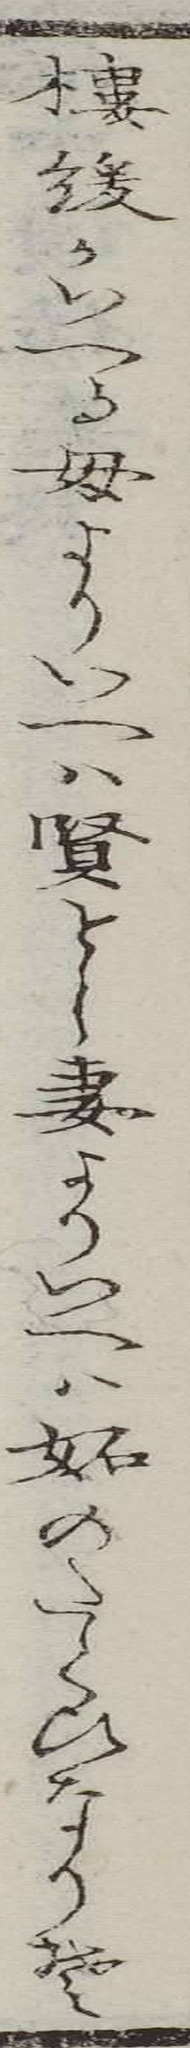楼後かいへる母よりいへは賢とし妻よりいへは妬のたくひなりそ
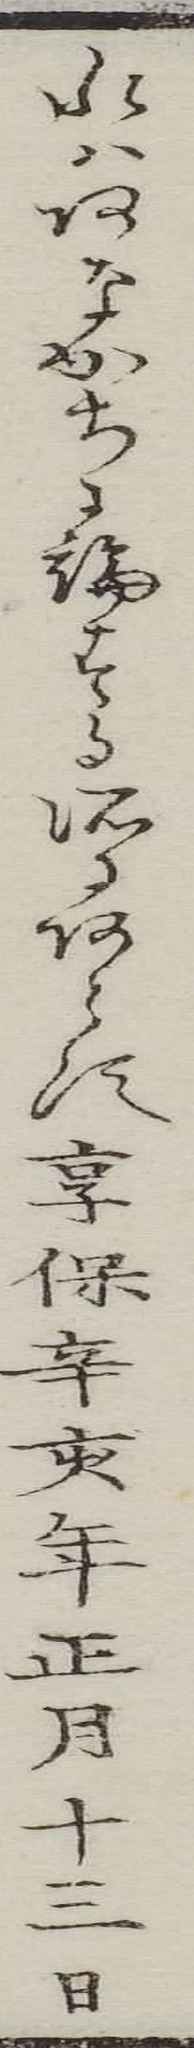れはあなかちに論する所にあらす享保辛亥年正月十三日
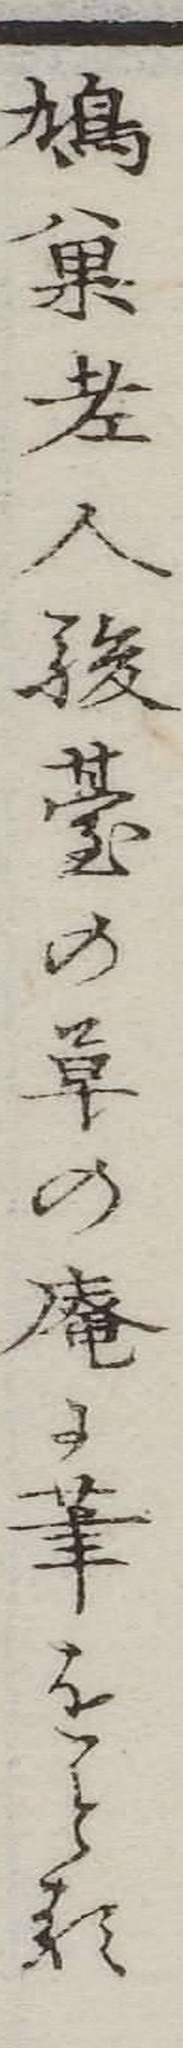鳩巣老人駿臺の草の庵に筆をとる

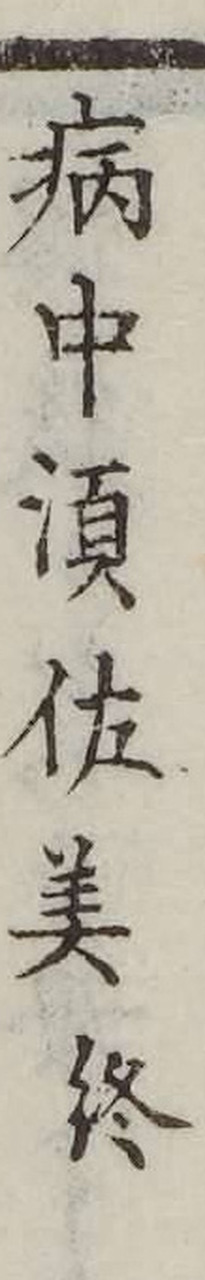病中須佐美終
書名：病中須佐美
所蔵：国文学研究資料館
